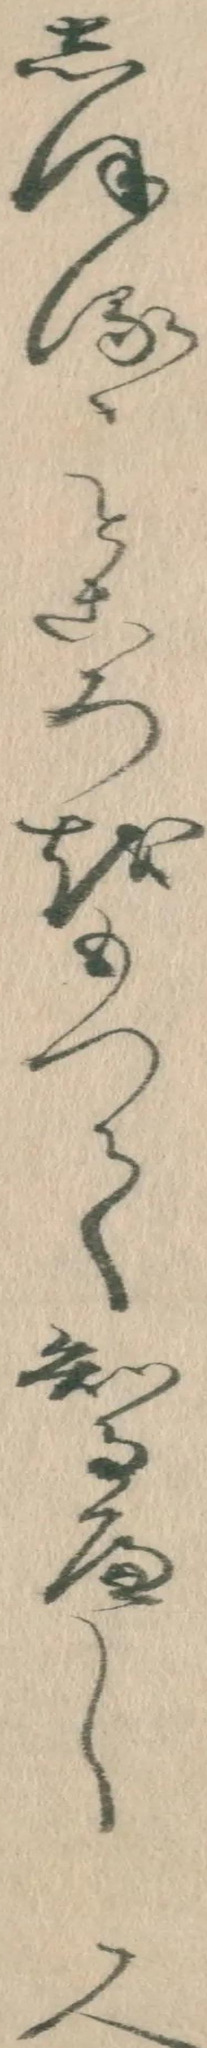しほるゝところをもつて知るへし人
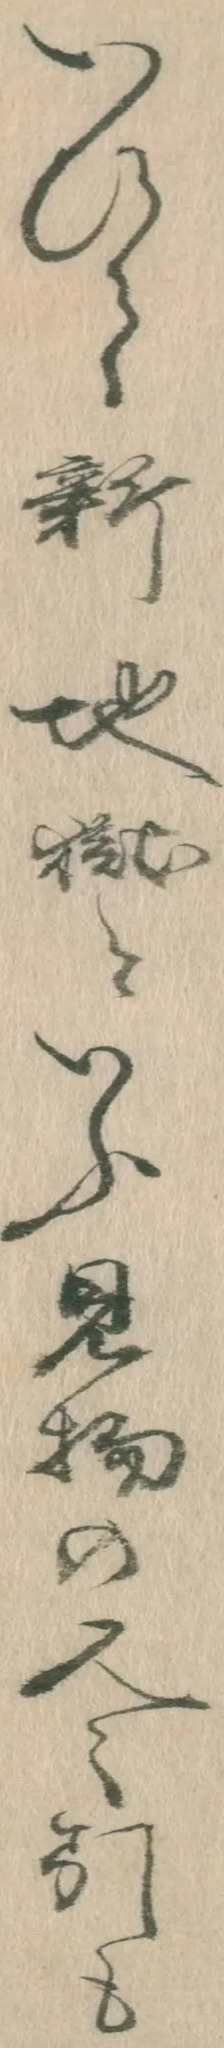いひて新地獄といふ見物の人〻引も
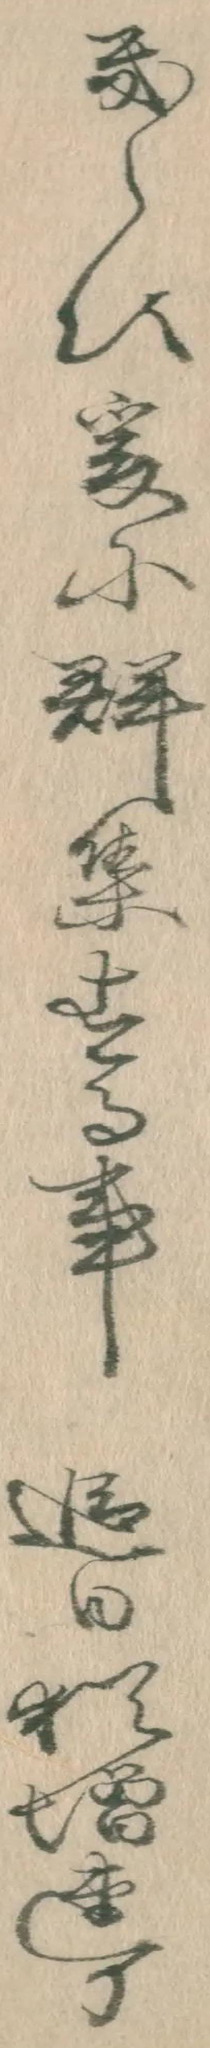きらす爰に群衆する事追日猶増れり
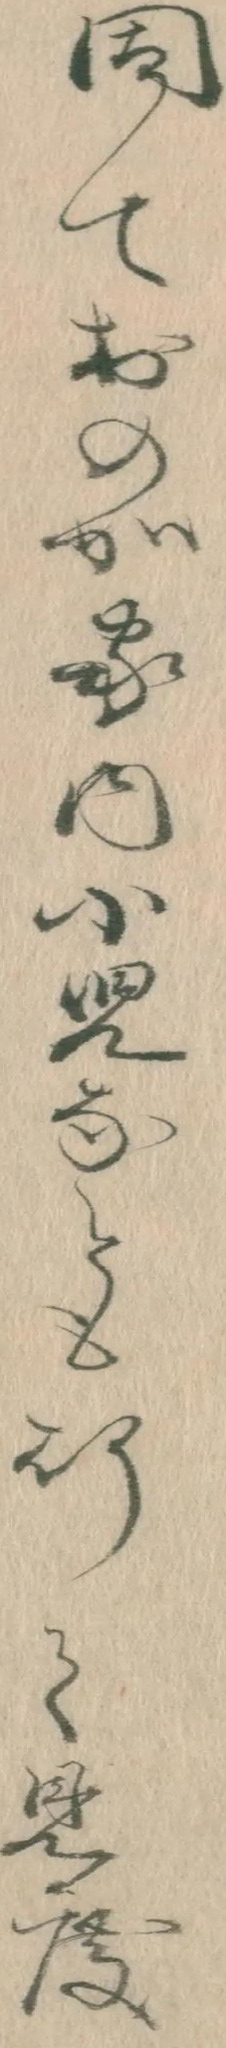因ておのが家内小児なとも行て見度
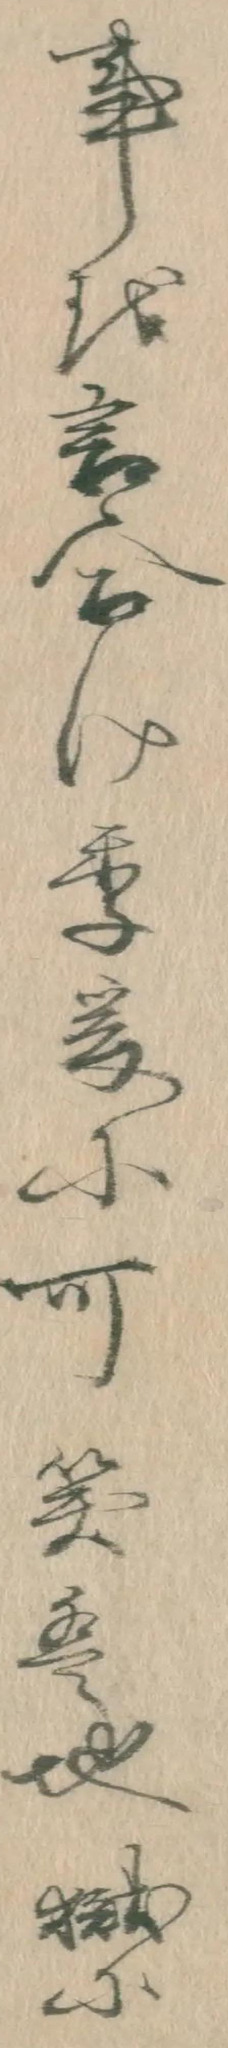事を言合けり爰に可笑は地獄に
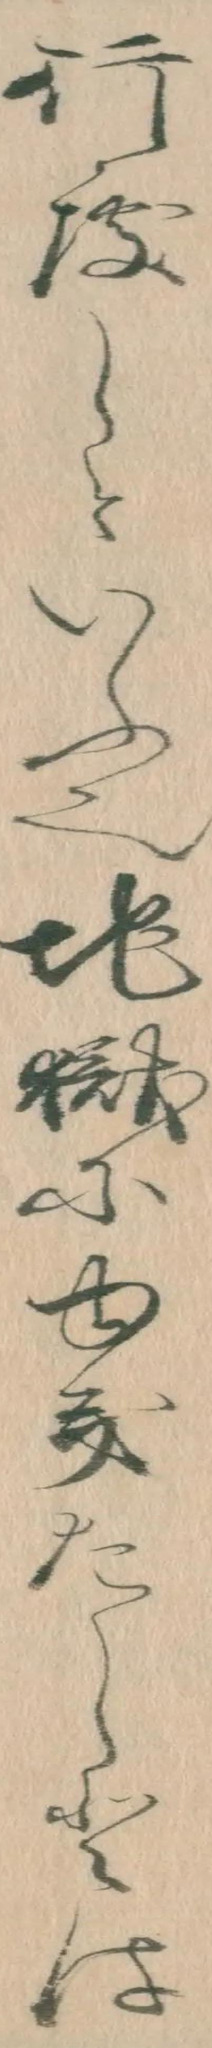行度しといふ也地獄にゆきたしとは
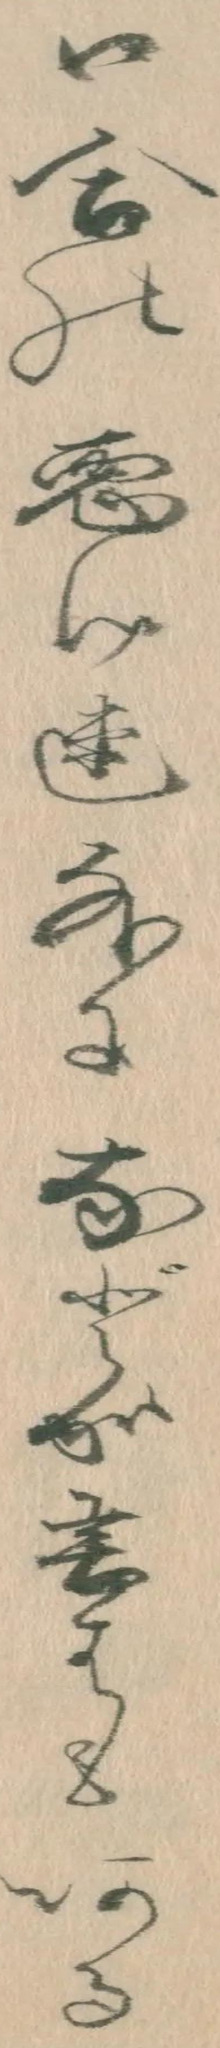口合の悪けれ外になどか言はもある
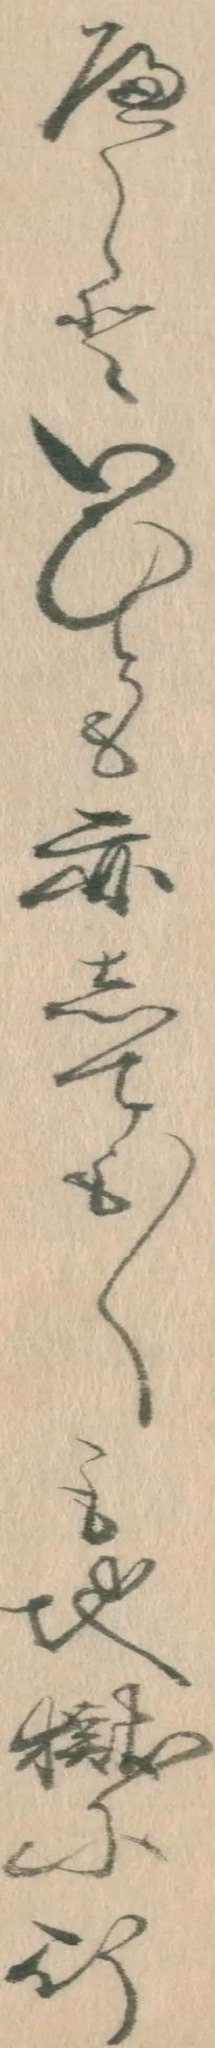へしといひとも亦しても〳〵も地獄に行
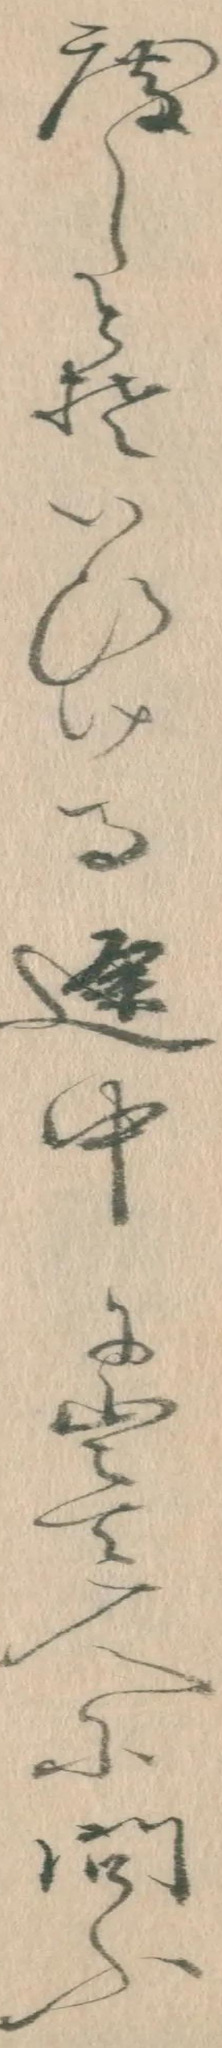度しとそいひける途中に出て人に問ふ
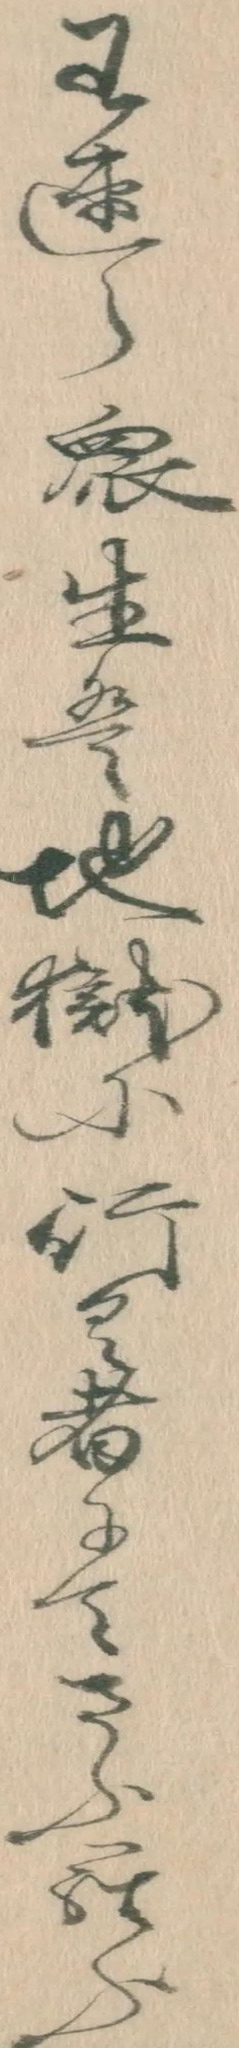われら衆生は地獄に行く者にさふらふ
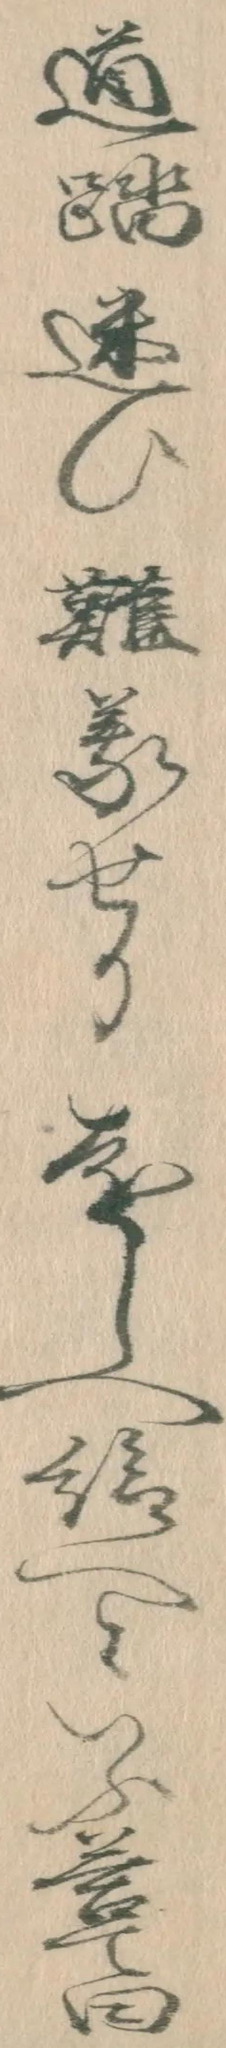道踏迷ひ難義せりをしへ給へといふ答て曰
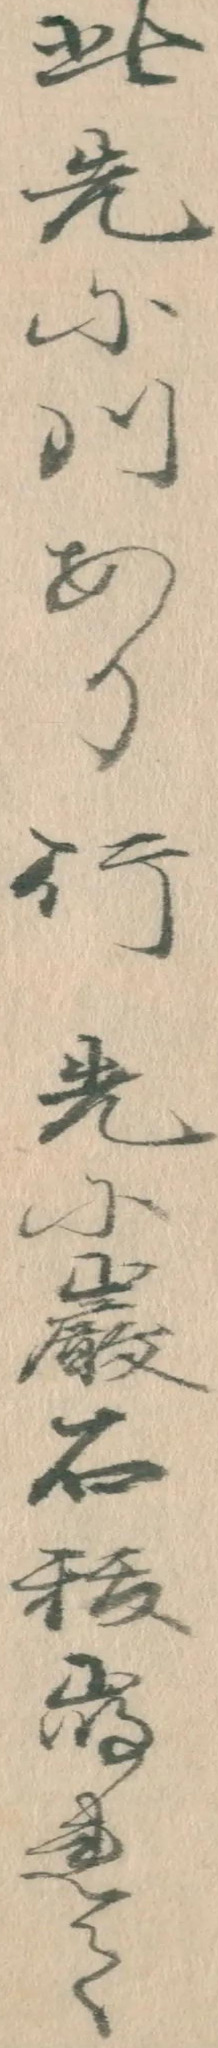此先に川あり行先に巌石抜崩れて
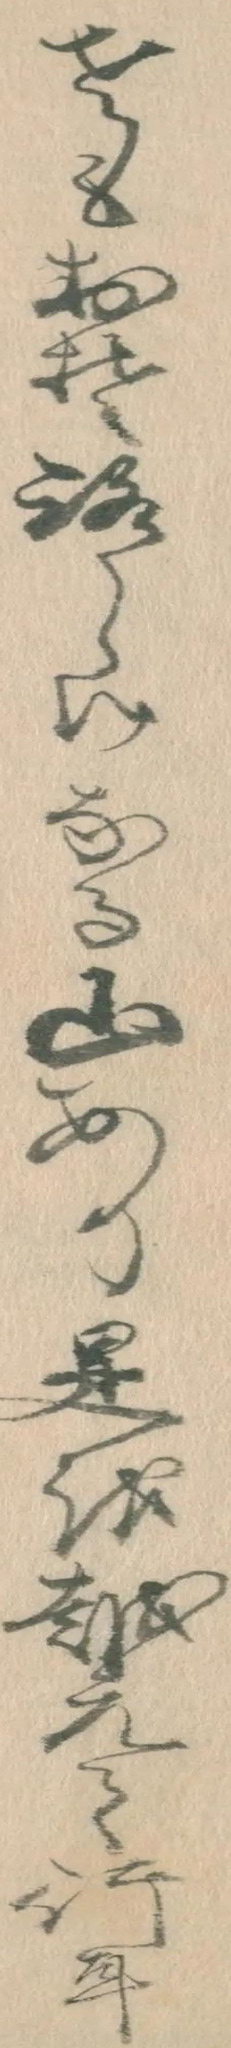さもおそろしけなる山あり是を越えて行に
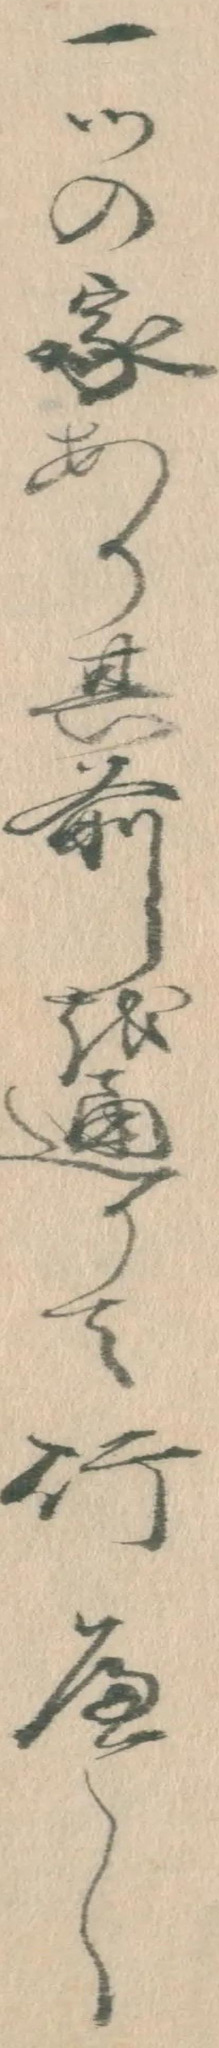一ツの家あり其前を通りていくへし
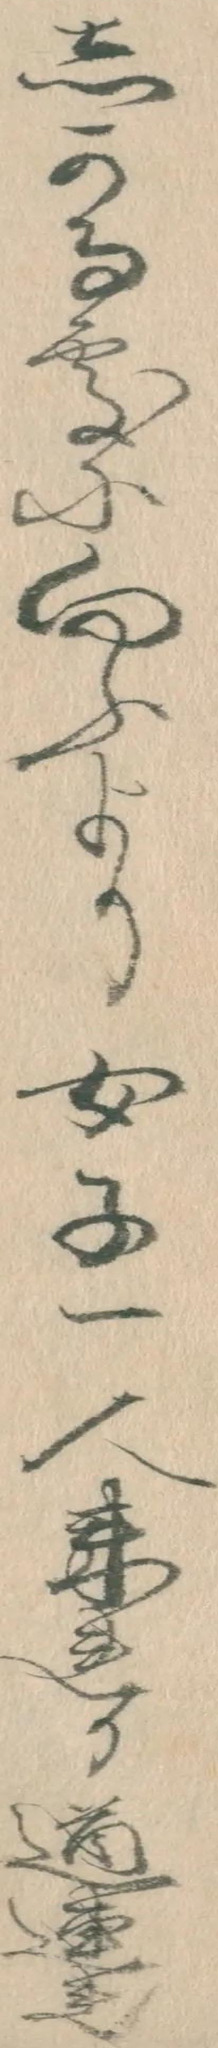しかる処に向ふより女子一人来れり道連れ

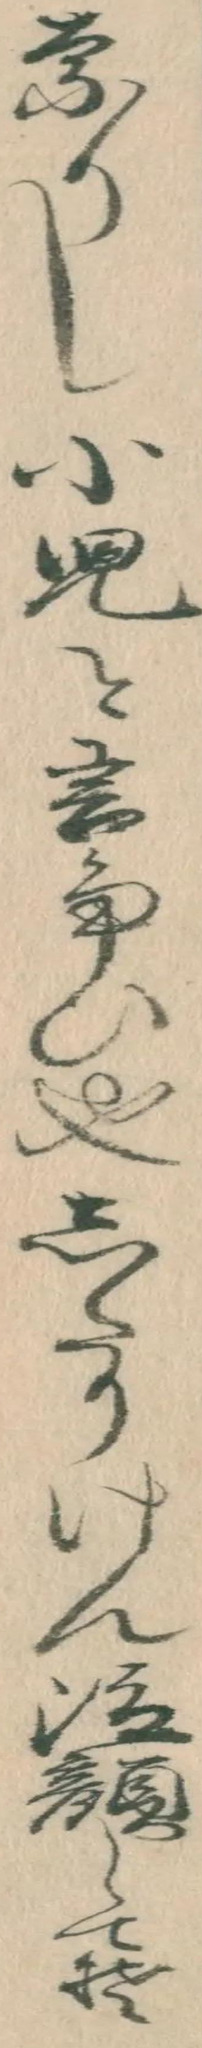なりし小児と言争ひやしたりけん泣顔してそ
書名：俗語之種. [6]
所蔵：国立国会図書館 National Diet Library, JAPAN
